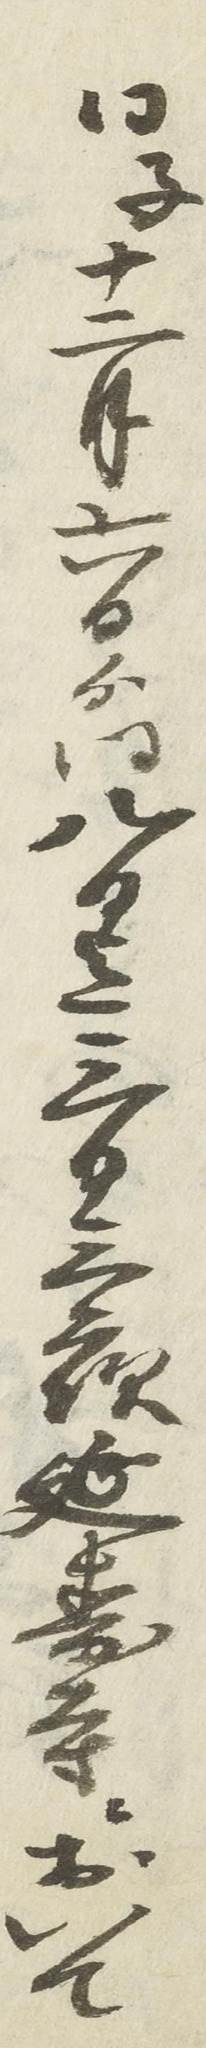一同子十二月六日ゟ同八日迄三日三夜延寿寺ニおいて
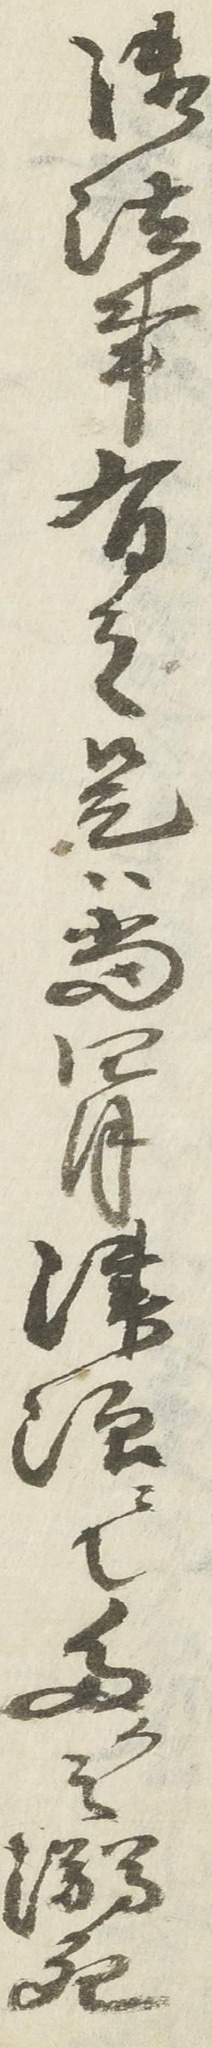御法事有之是は当四月津浪ニて多ク之溺死
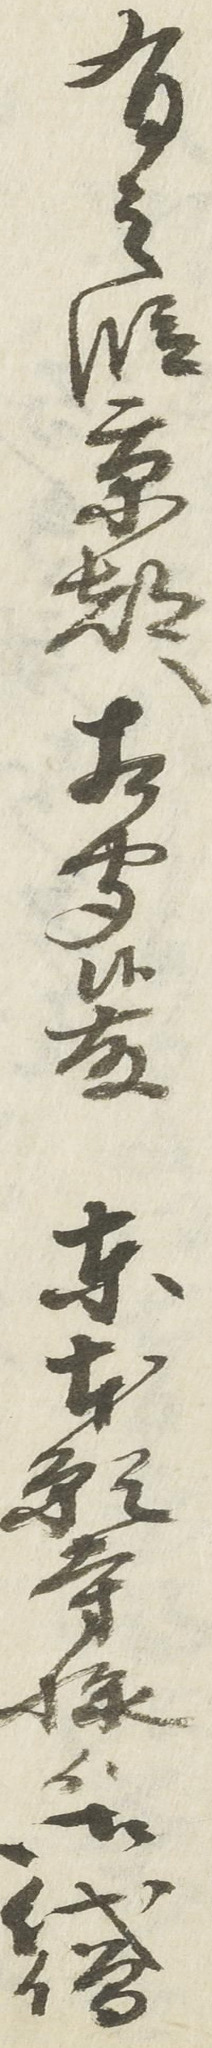有之段京都へ相聞候故東本願寺様ゟ御代僧
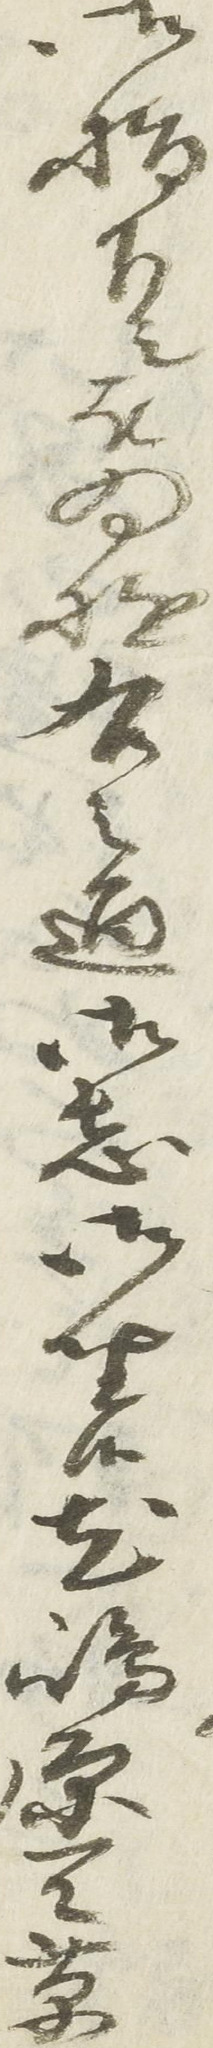御指下シ被為遊右之通御志御座候尤嶋原天草
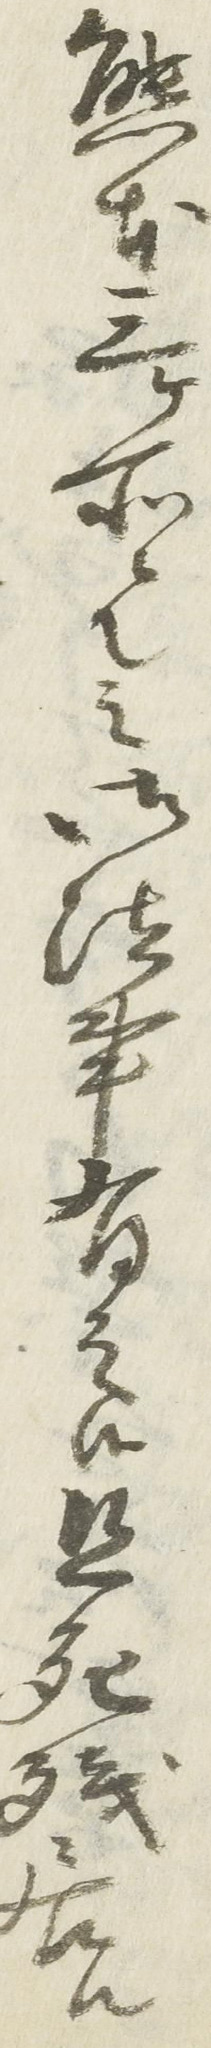熊本三ケ所ニて之御法事有之候且死残居ル
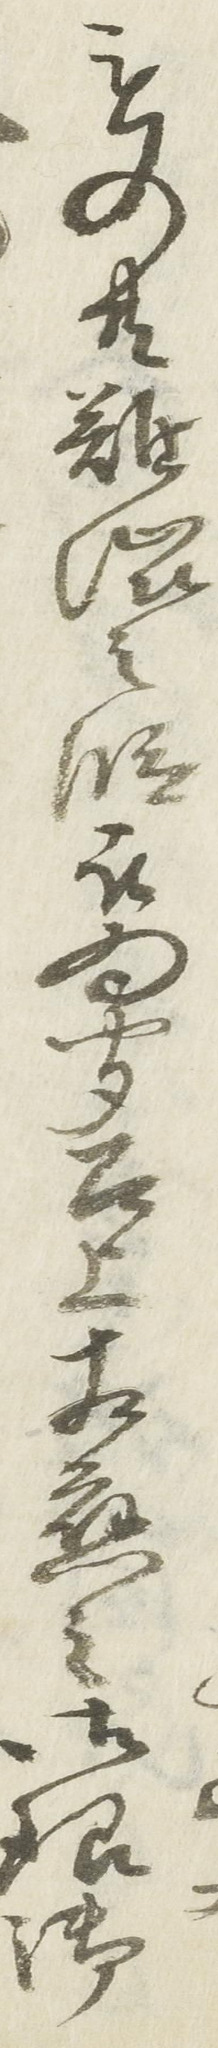もの共難渋之段被為聞召上相応之御銀御
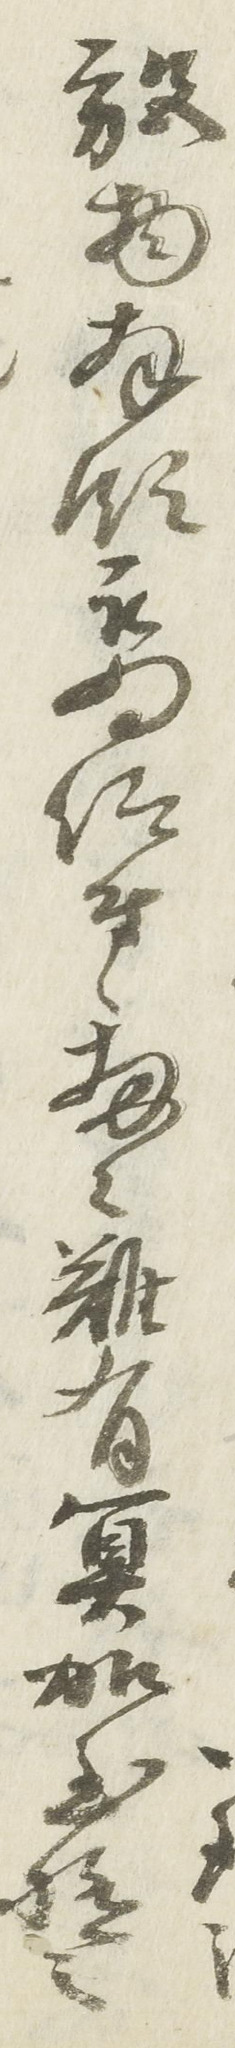穀物拝領被為仰付候扨々難有冥加至極之御
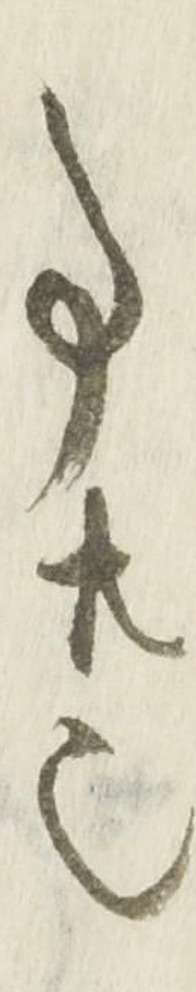事共也
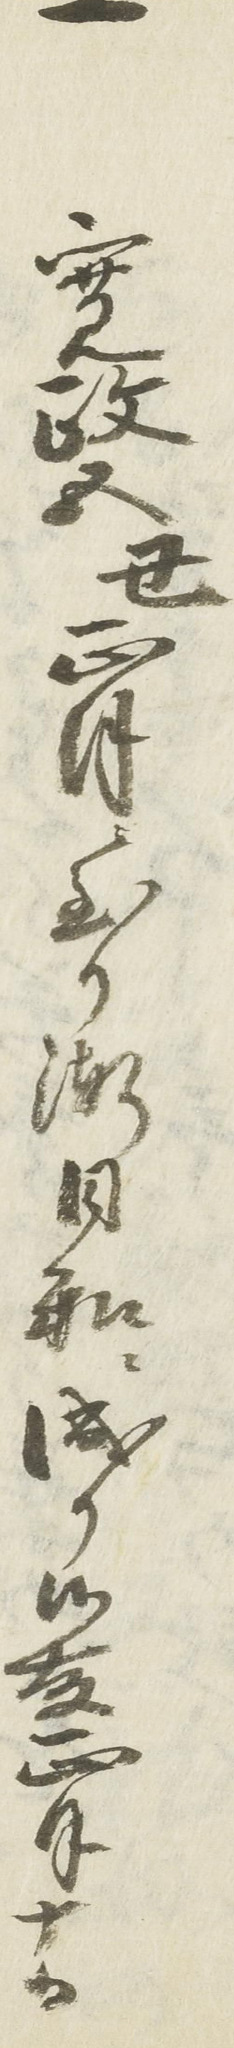一寛政五丑正月ニ至り漸日和ニ成候故正月十日
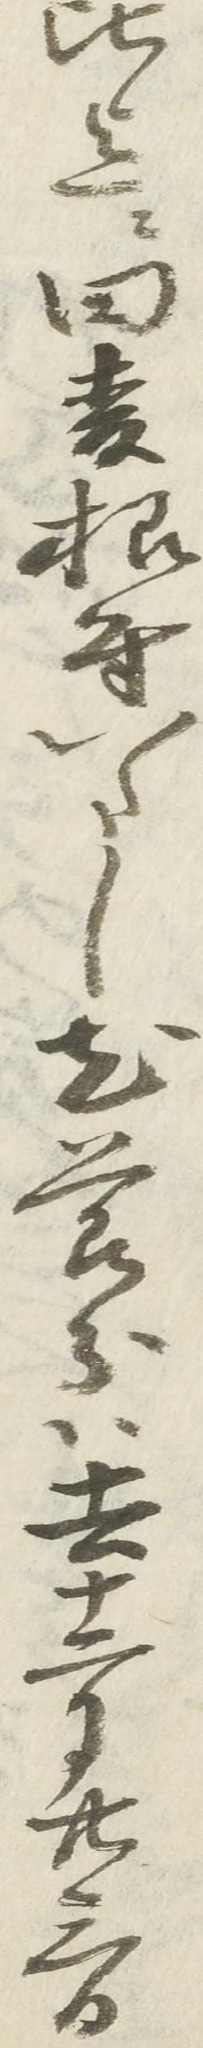比迄ニ同麦根付いたし尤節分は去十二月廿三日
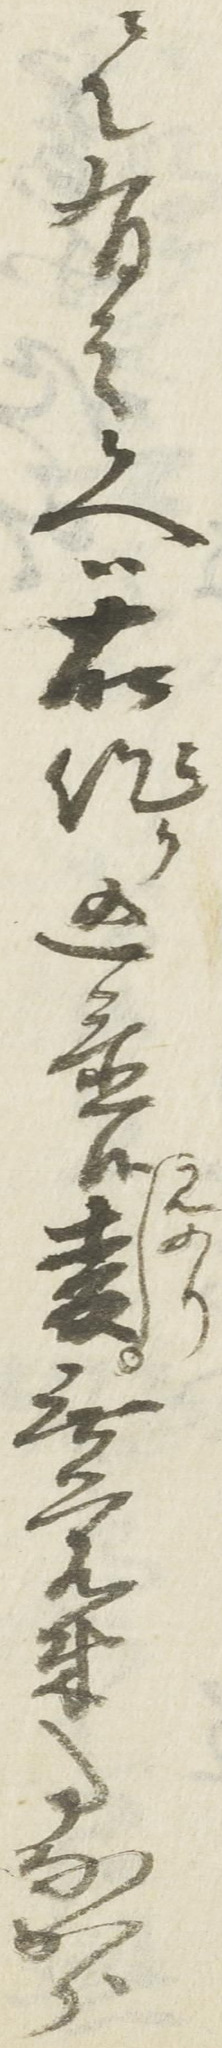ニて有之候へは右作り込置候麦みのり無覚束事なから
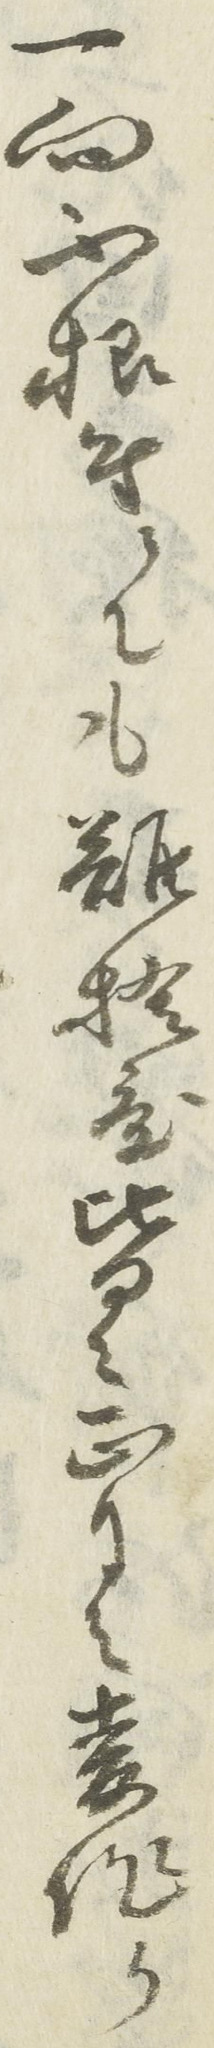一向不根付ニても難捨置皆々正月之麦作り
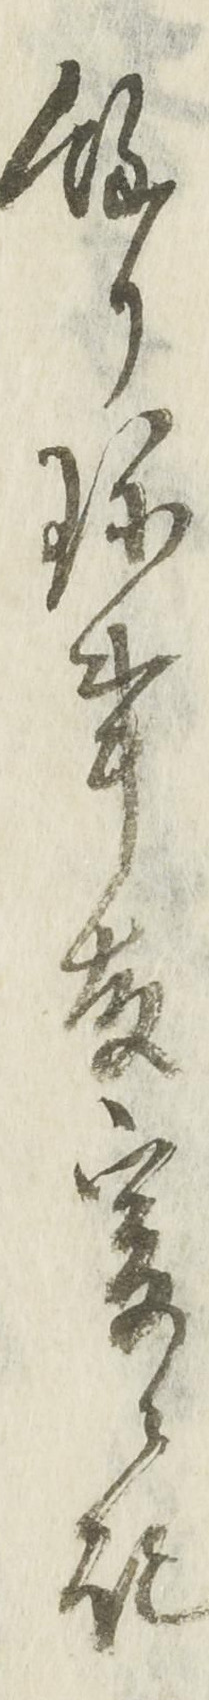餘り珍事故爰ニ記
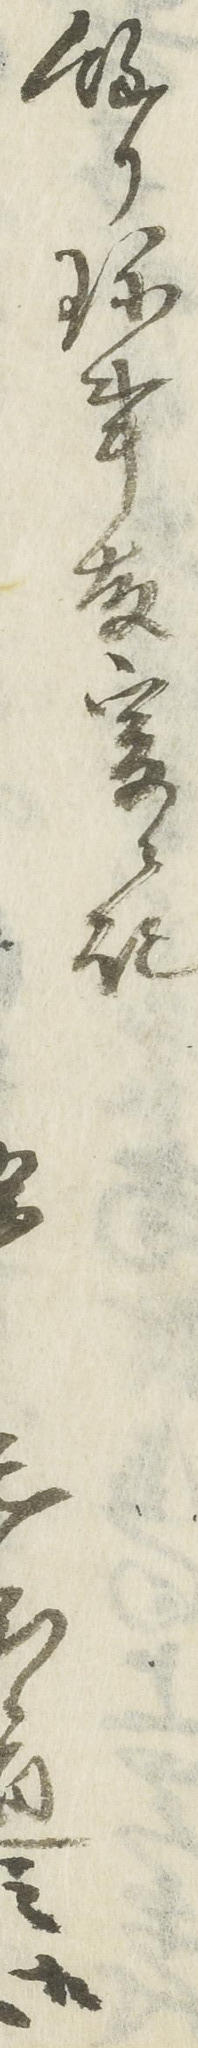餘り珍事故爰ニ記
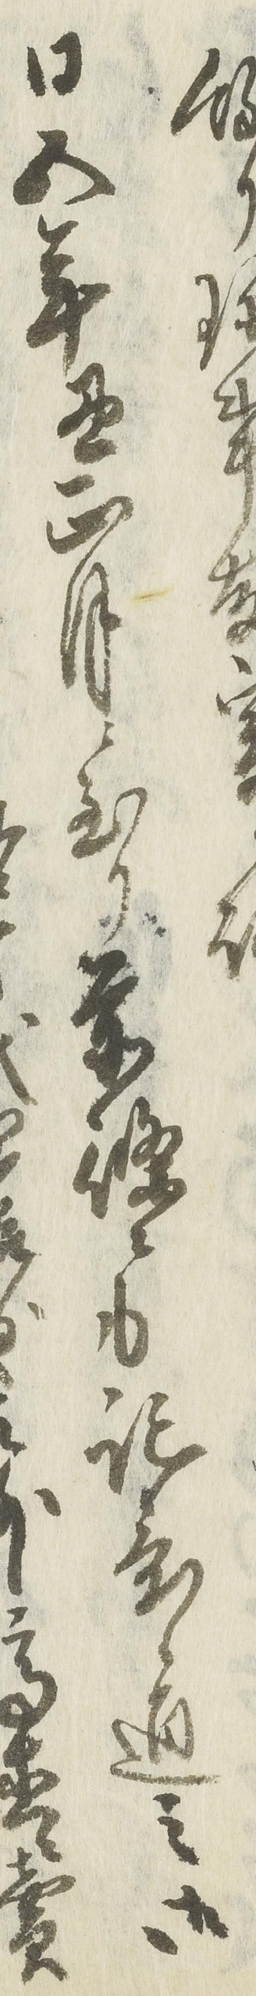一同五年丑正月ニ至り前条ニも記置之御通之御
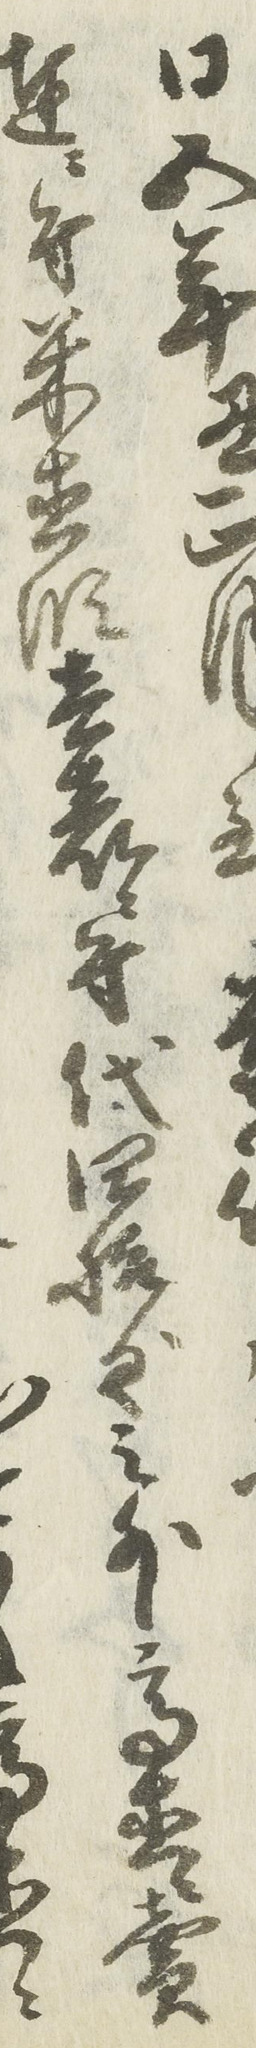達ニ付米直段壱表ニ付代四拾匁之御外高直ニ売
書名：後見笑
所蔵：東京大学地震研究所図書室 Earthquake Research Institute Library, The University of Tokyo, JAPAN
